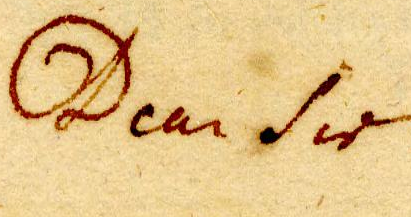Dear Sir
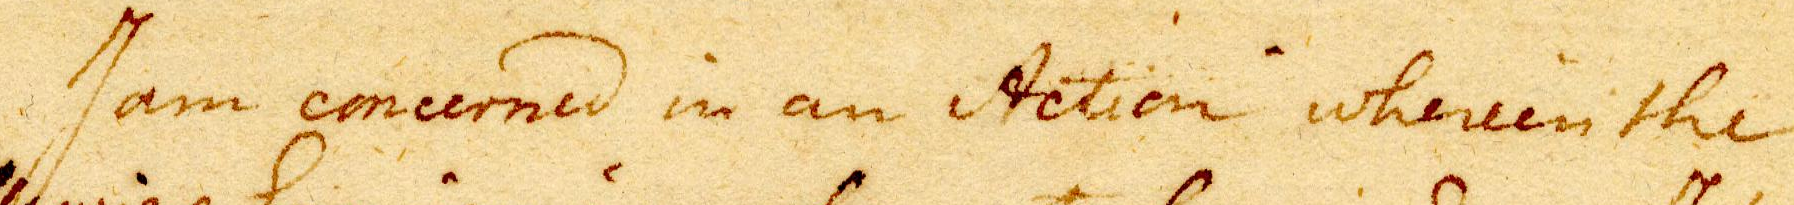I am concerned in an Action wherien the
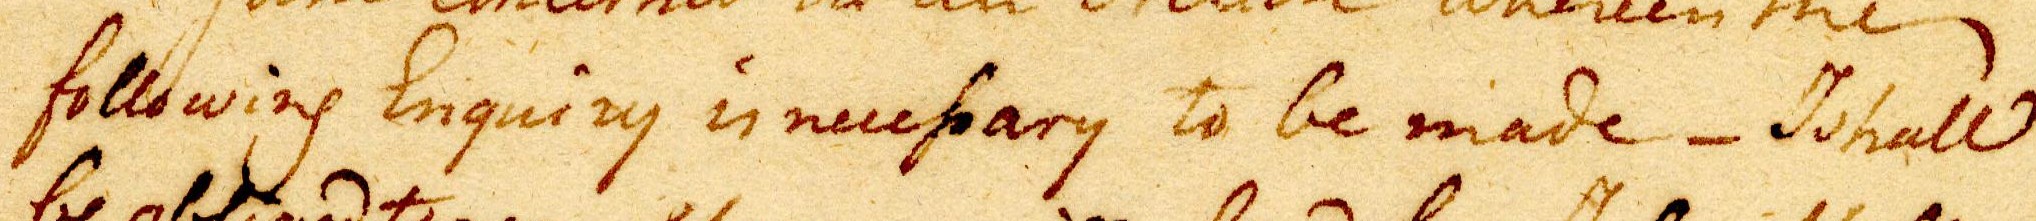following Enquiry is necessary to be made. I shall
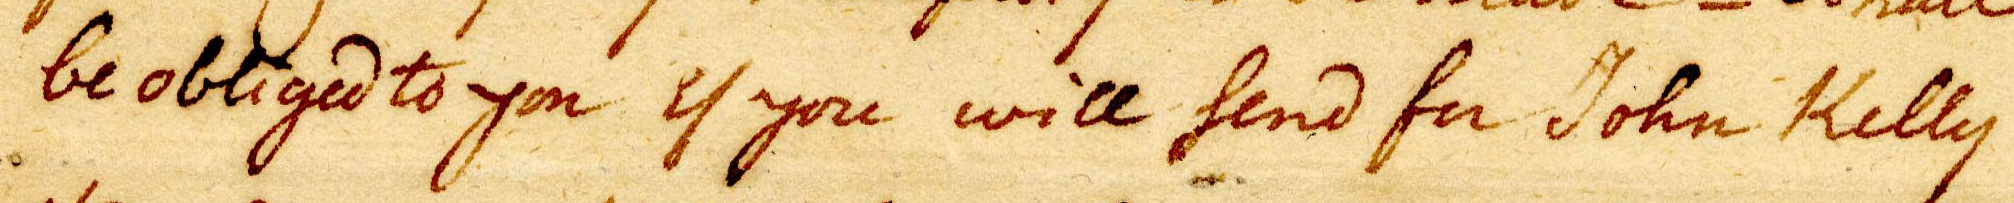be obliged to you if you will send for John Kelly
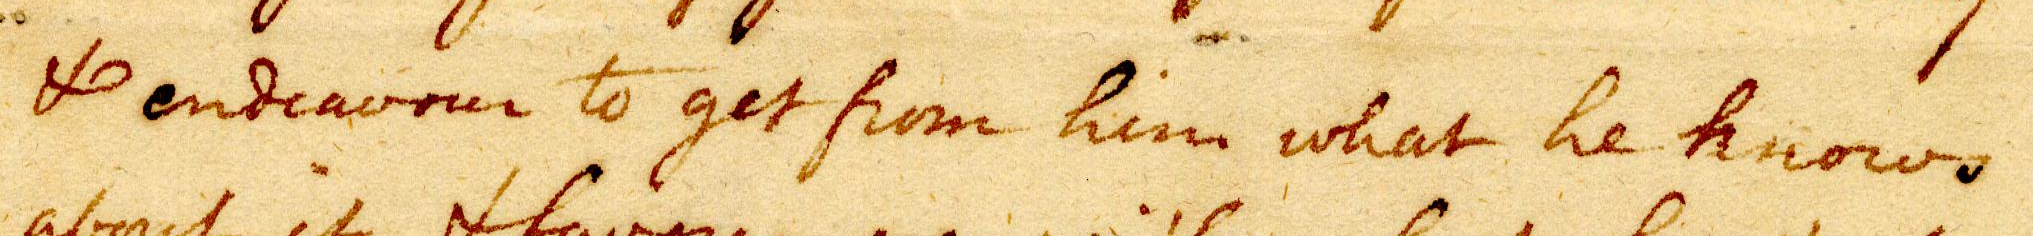& endeavour to get from him what he knows
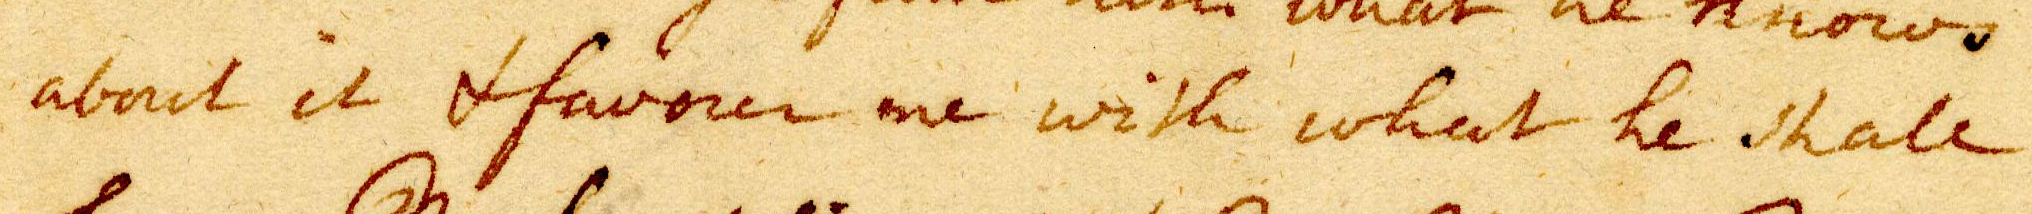about it & favour me with what he shall
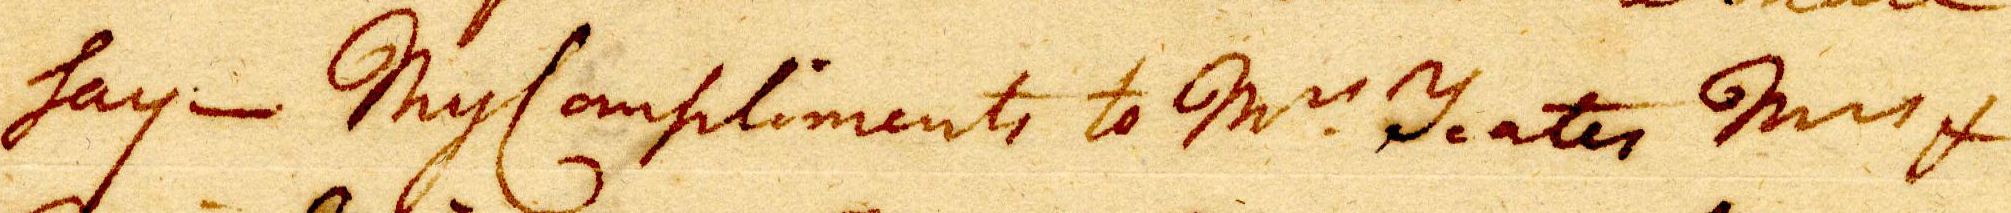say. My Compliments to M^rs. Yeates M^rs &
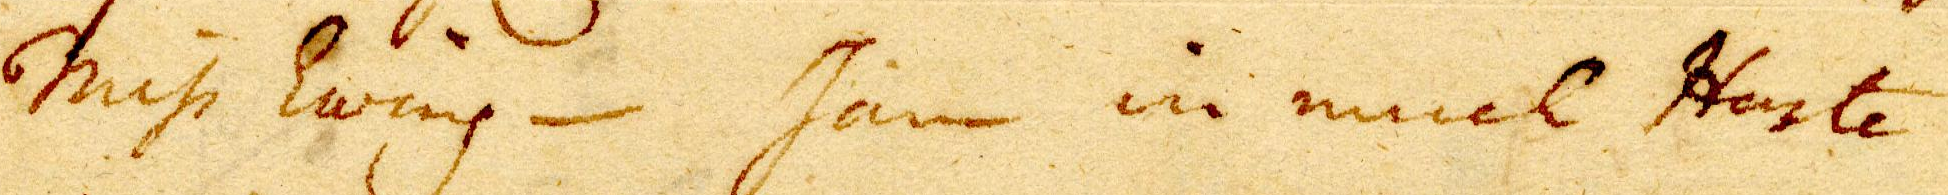Miss Ewing. Join in much Haste
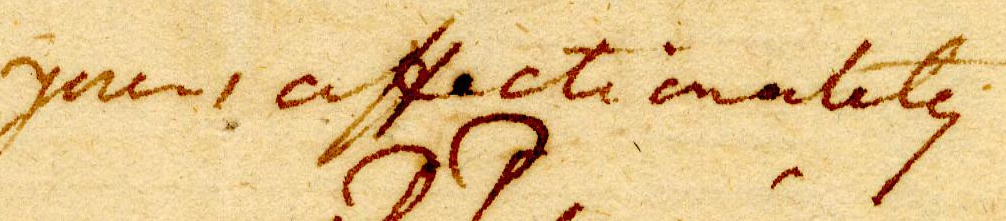yours affectionately
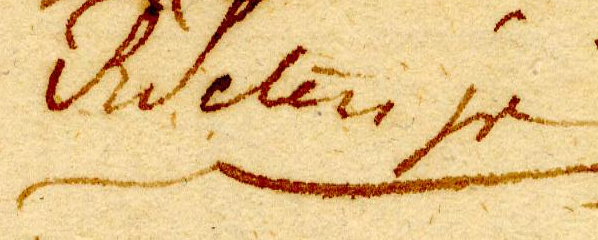R. Peters Jr
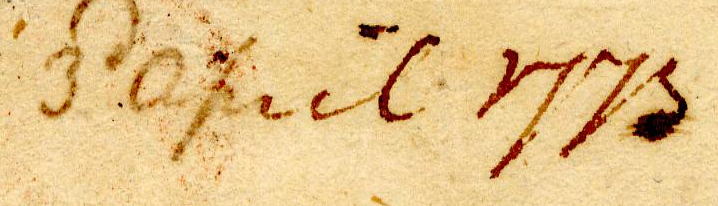3 April 1773
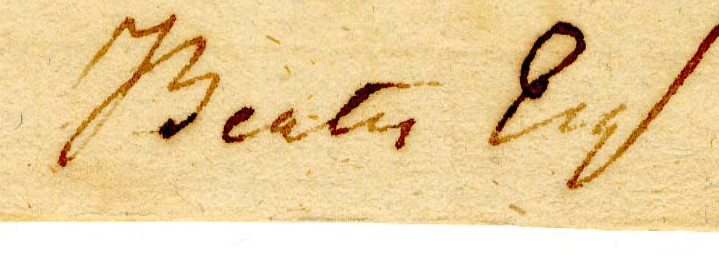Beates Esq^r
